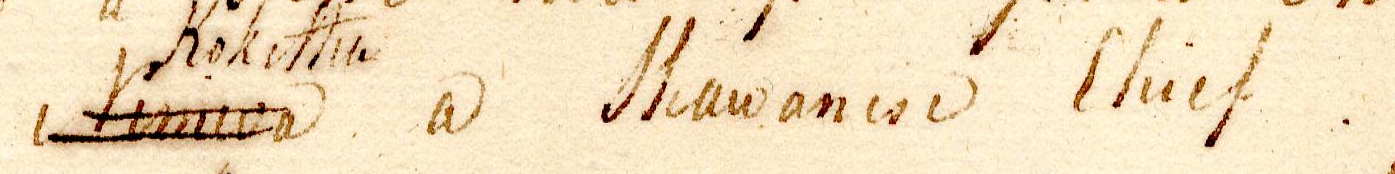Nemwa ^ a Shawanese Chief
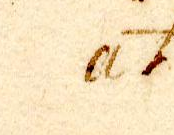at
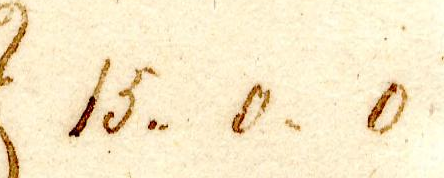15. 0. 0
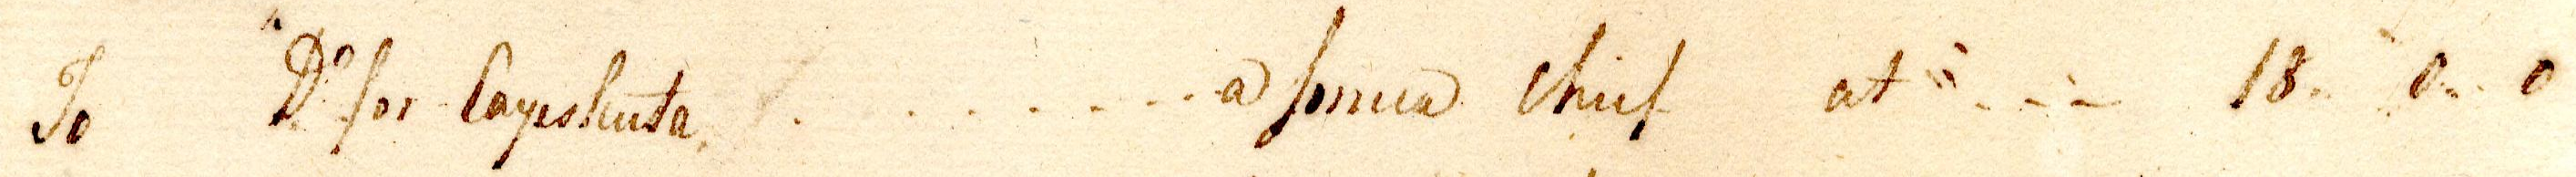To D^o for Cayeshuta....... a Seneca Chief at "...... 18. 0. 0
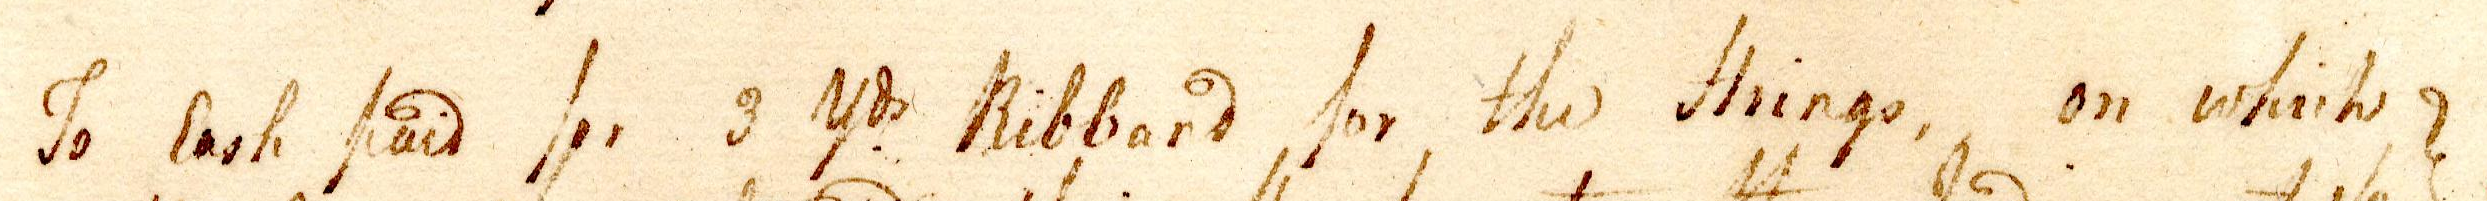To cash paid for 3 Y^ds Ribbard for the Strings, on which
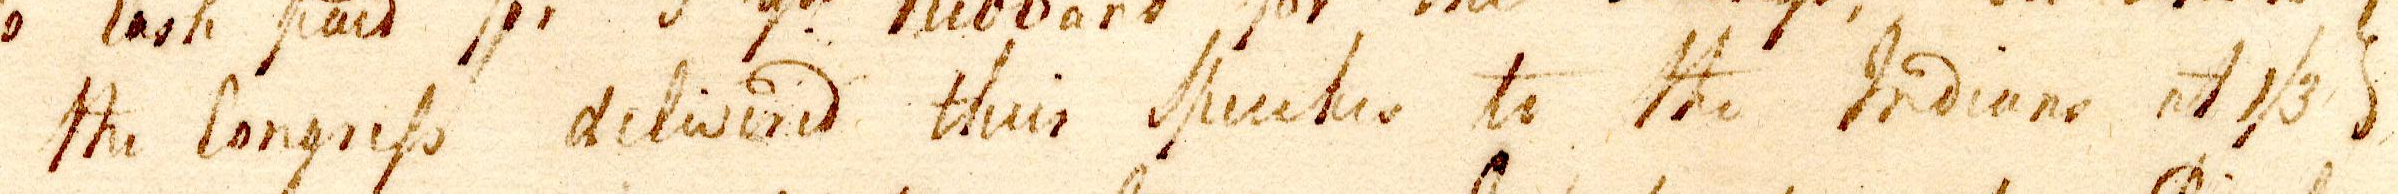the Congress delivered their Speeches to the Indians at 1s3
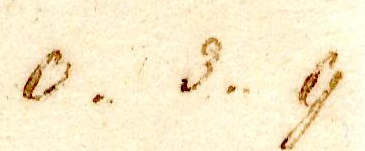0. 3. g
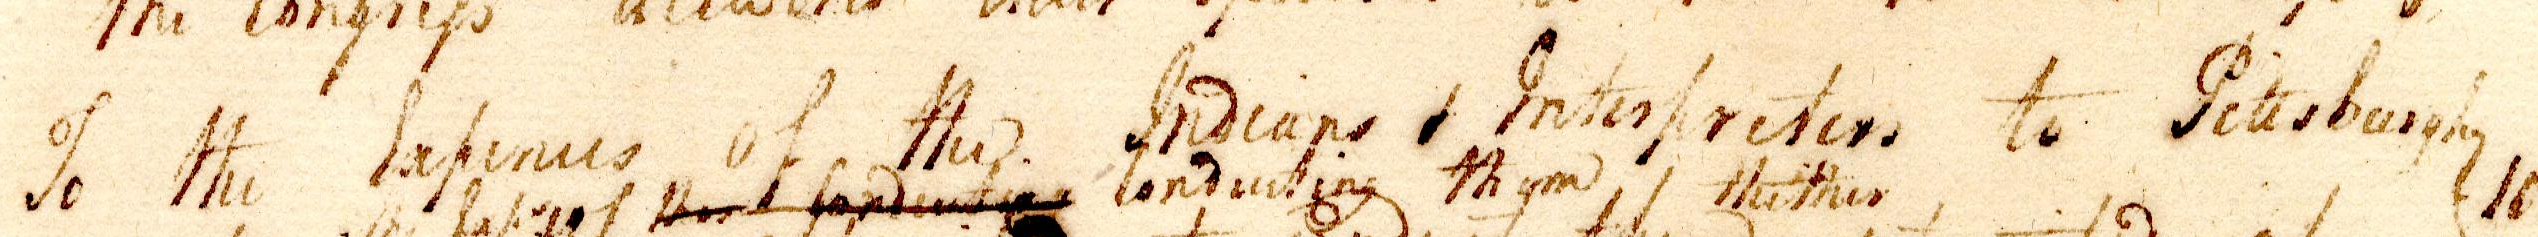To the Expenses of the Indeans & Interpreters to Pittsburgh
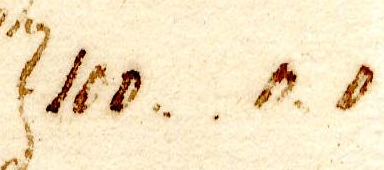100. 0. 0
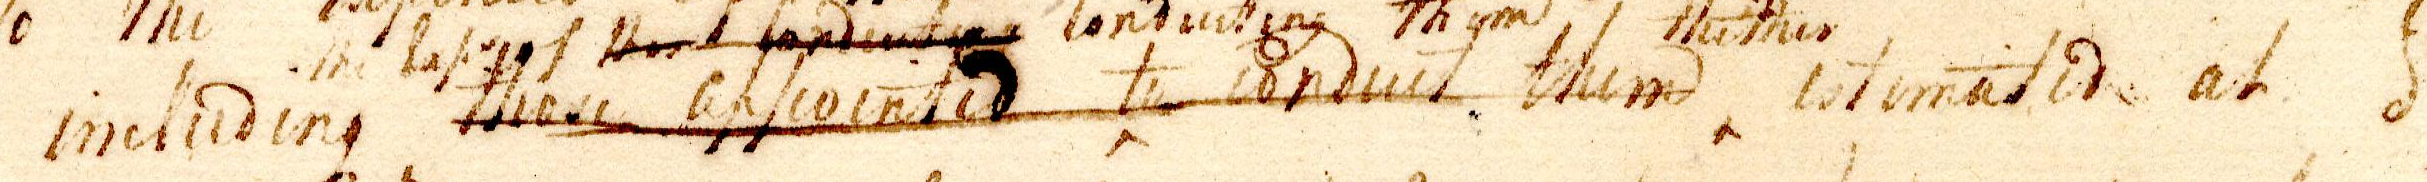including those appointed ^ to conduct them ^ estimated at
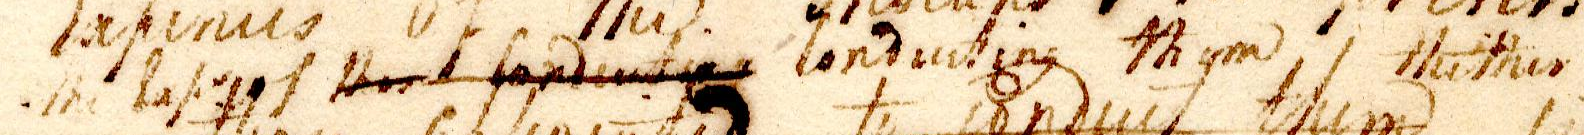in Express the Conducting Conducing them thither
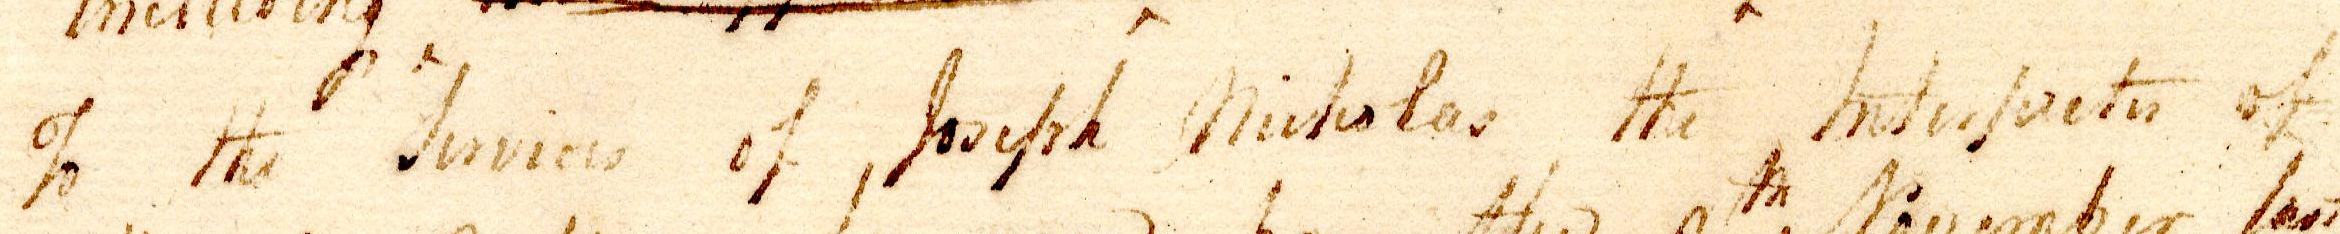To the Services of Joseph Nicholas the Interpreter of
